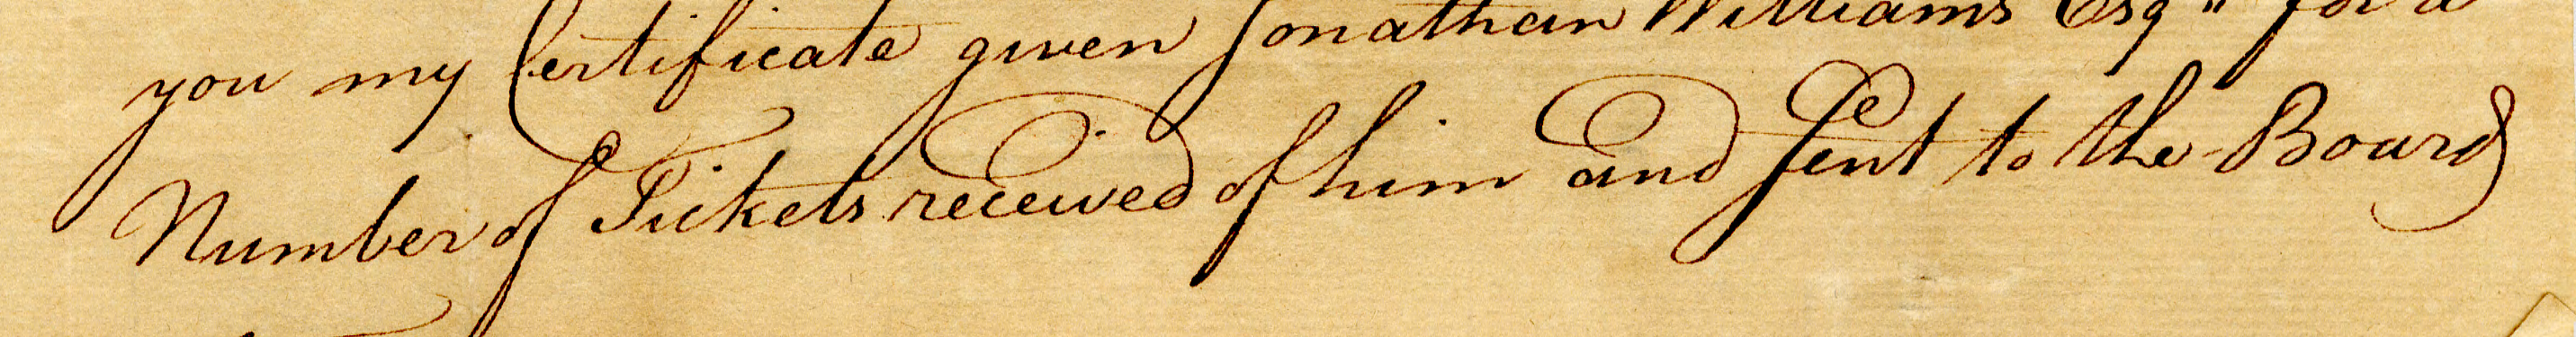number of Tickets received of him and Sent to the Board
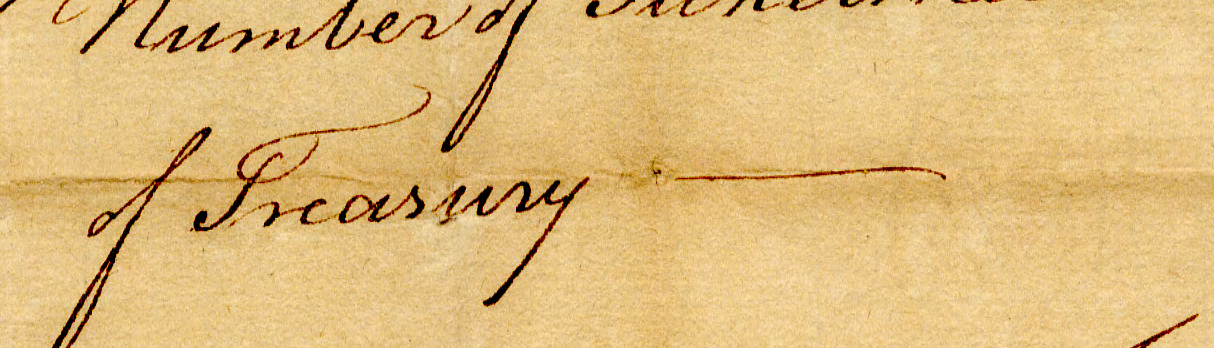of Treasury-
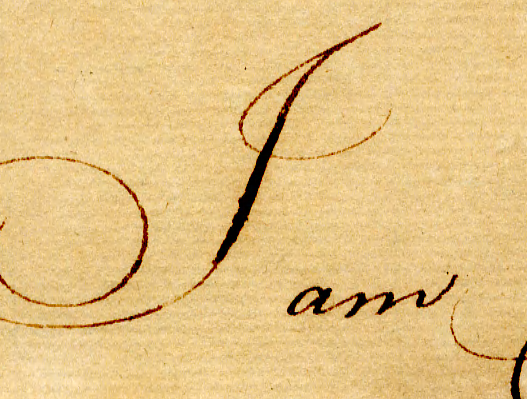I am
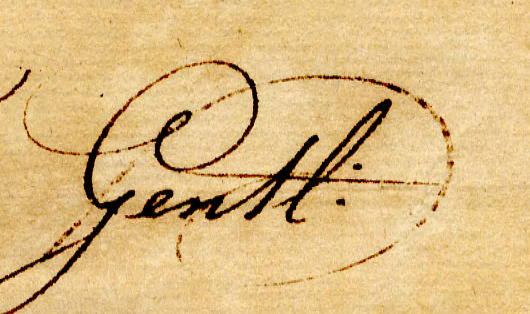Gentl:
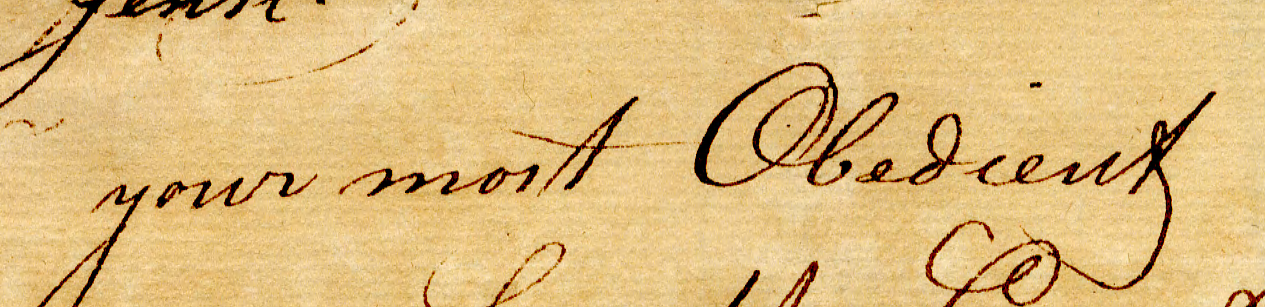your most Obedient
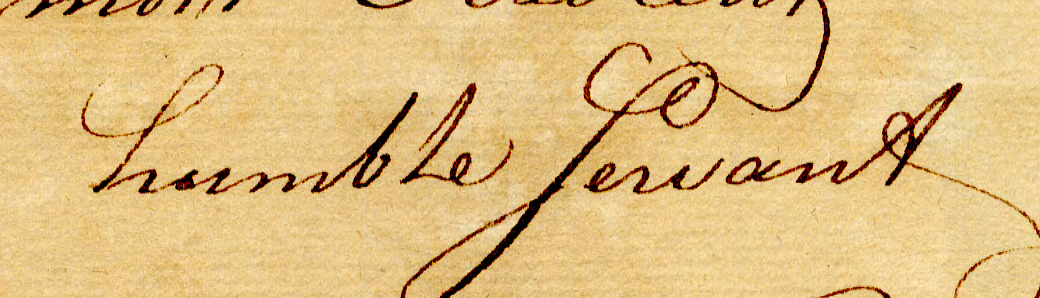humble Servant
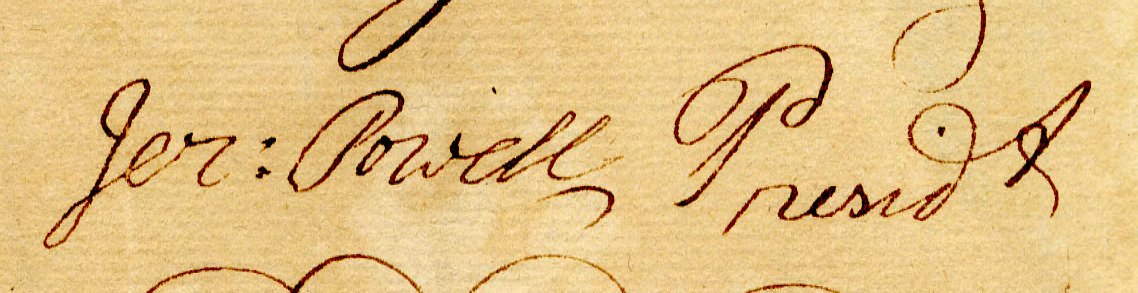Jer: Powell Presid^t
